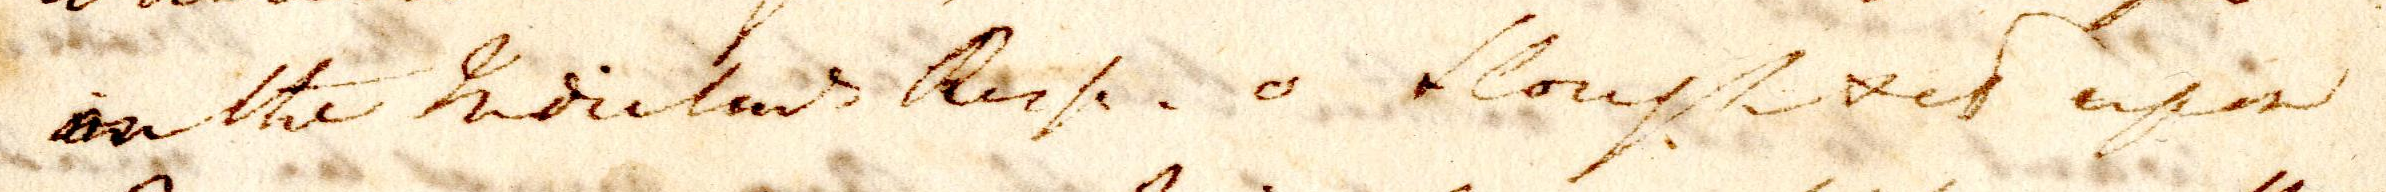on the Indictm^t. Resp. a Sloughsed upon
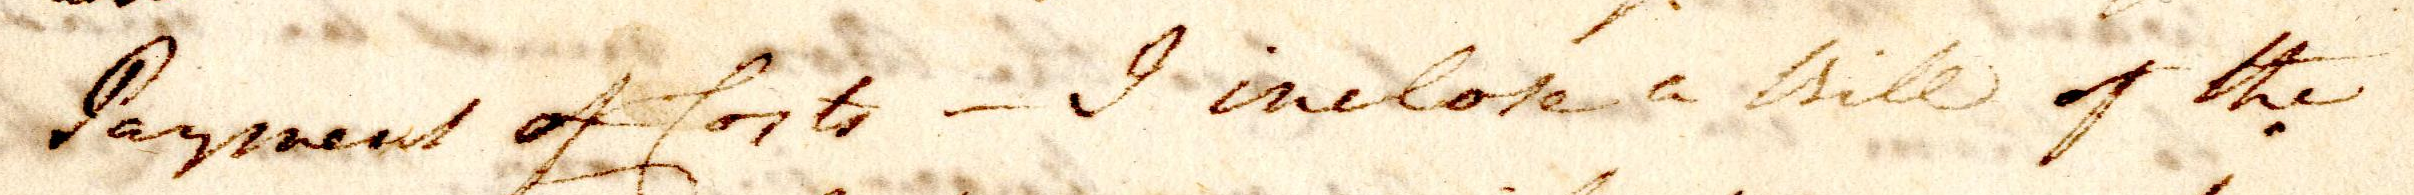Payment of Costs. I inclose a Bill of the
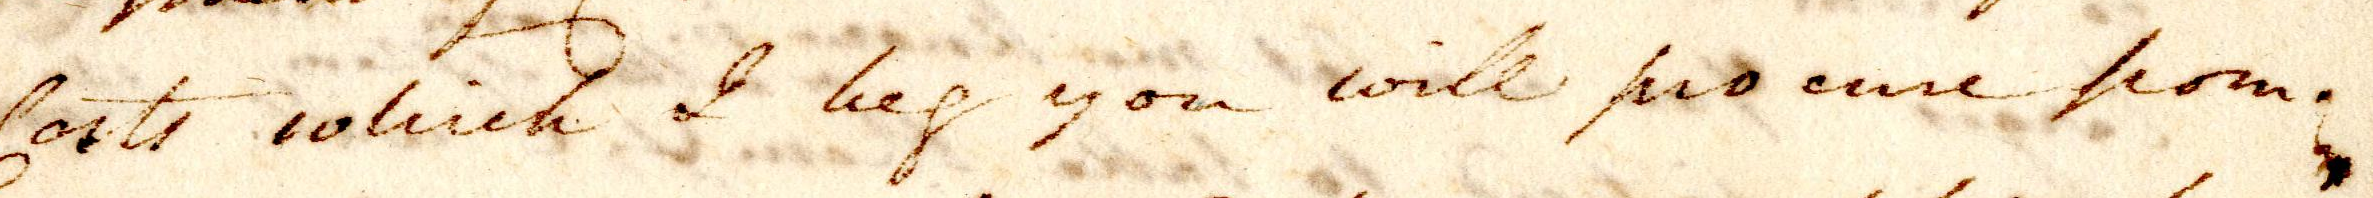Costs which I beg you will procure from
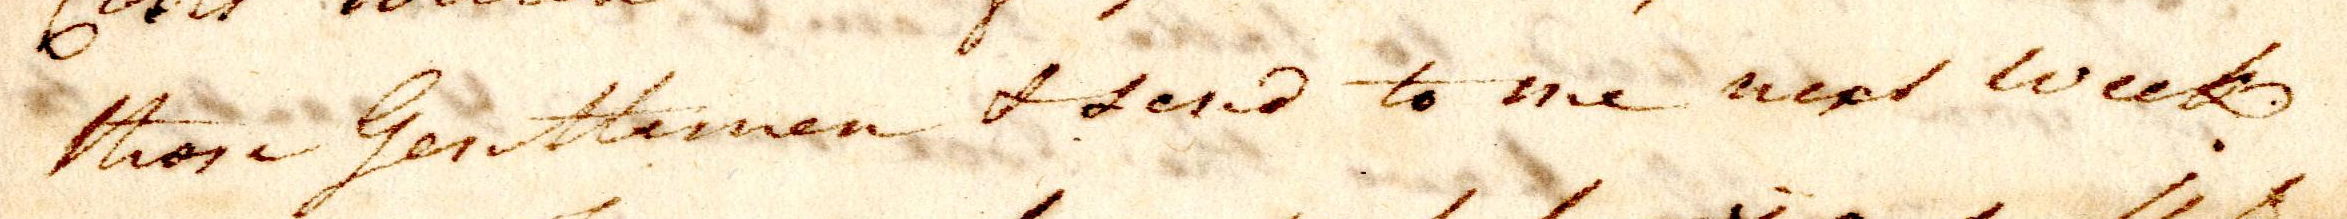those Gentlemen & send to me next week
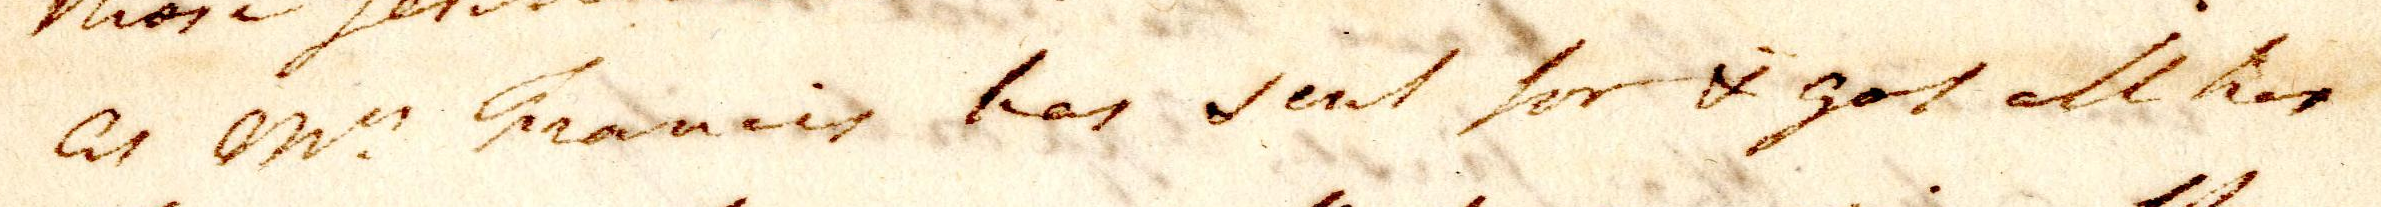as M^rs. Francis has sent for & got all her
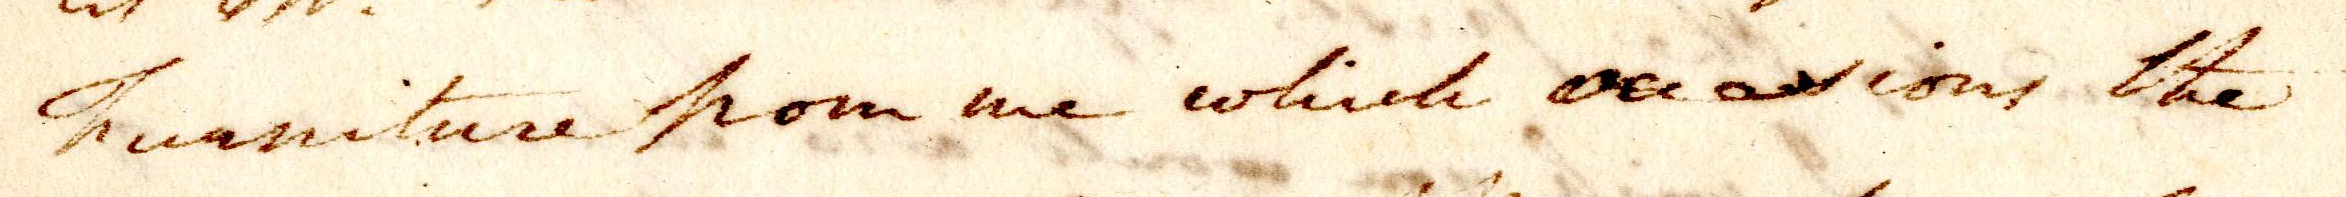Furniture from me which occasions the
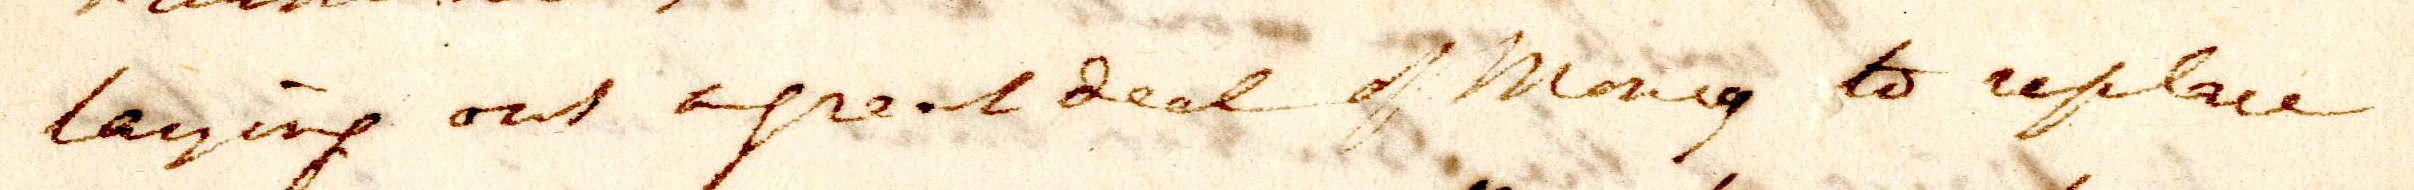laying out a great deal of Money to replace
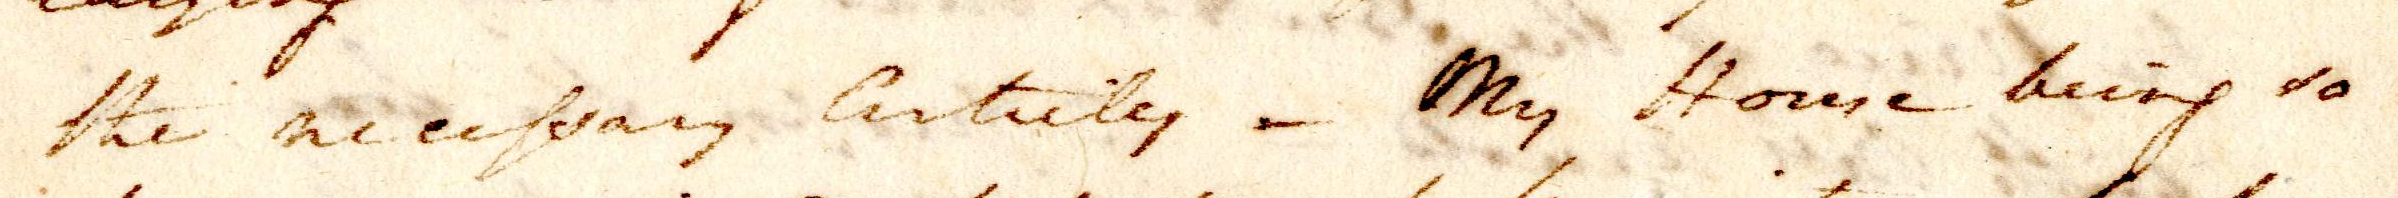the necessary Articles. My House being so
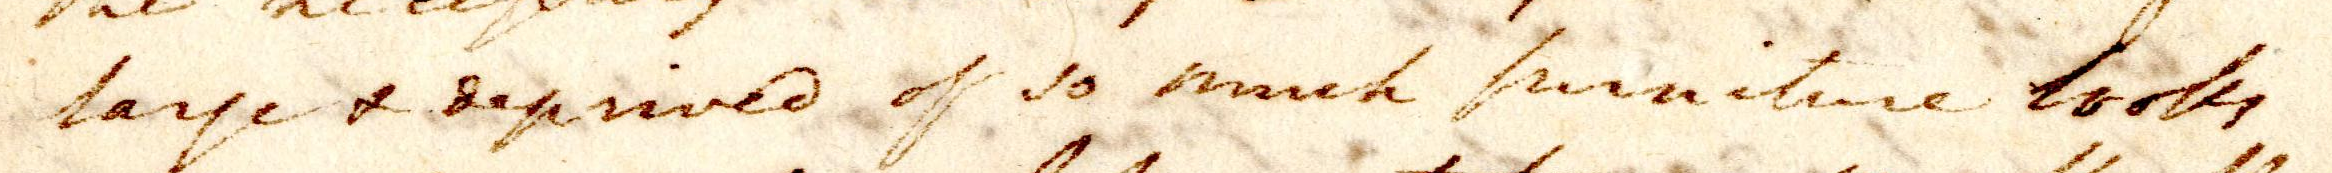large & deprived of so much furniture looks
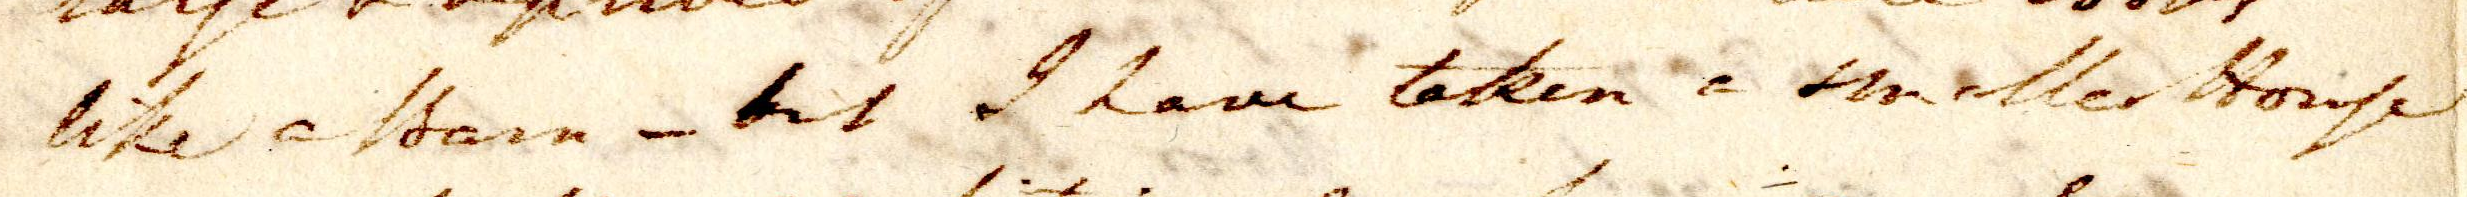like a Barn. but I have taken a smaller House
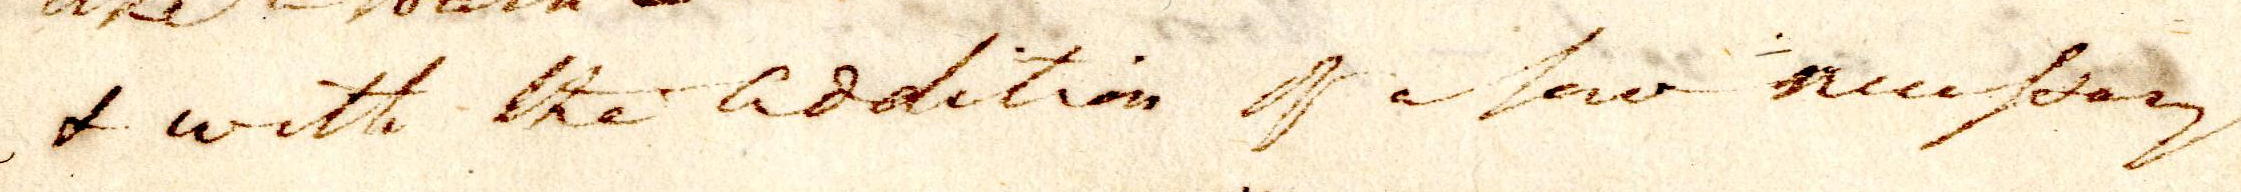& with the Addition of a few necessary
